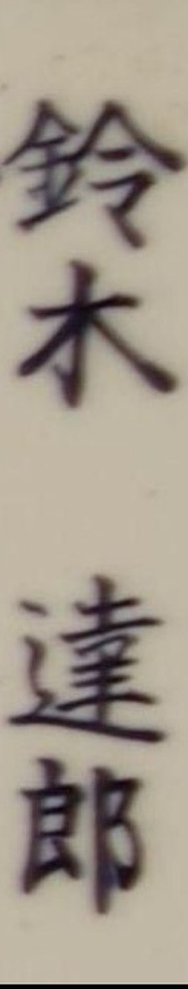鈴木達郎
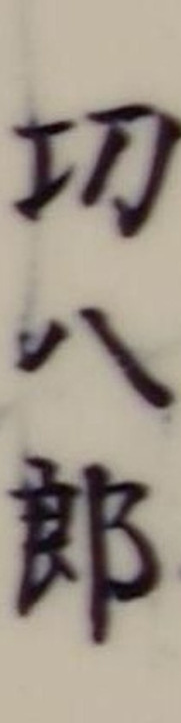功八郎
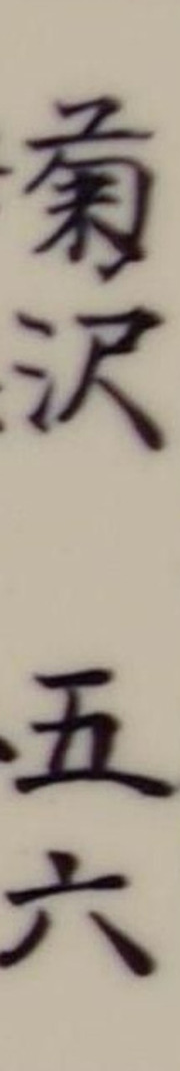菊沢五六
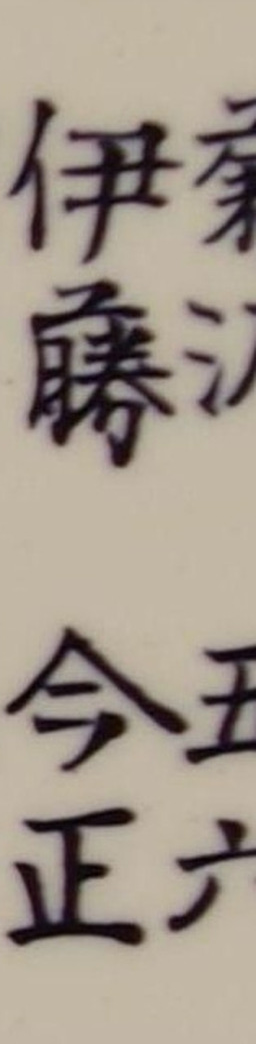伊藤今正
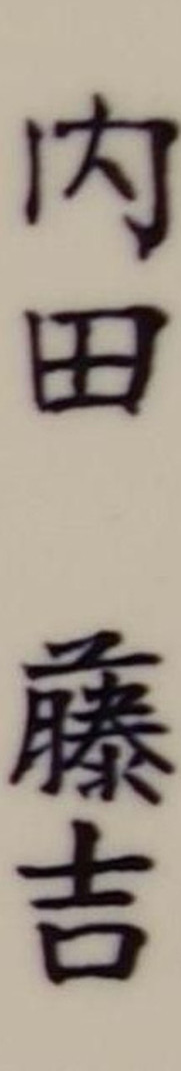内田藤吉

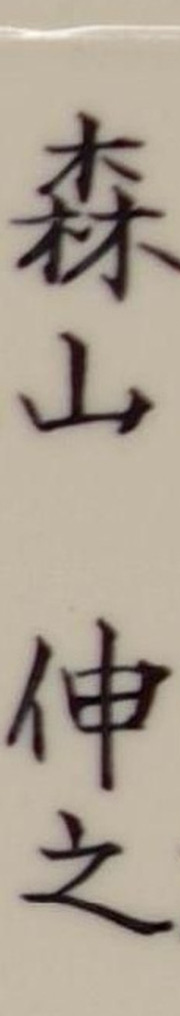森山伸之
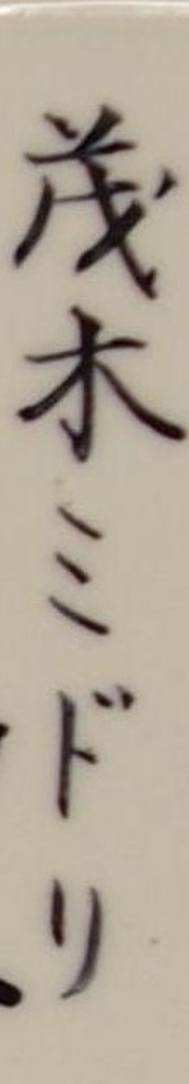茂木ミドリ
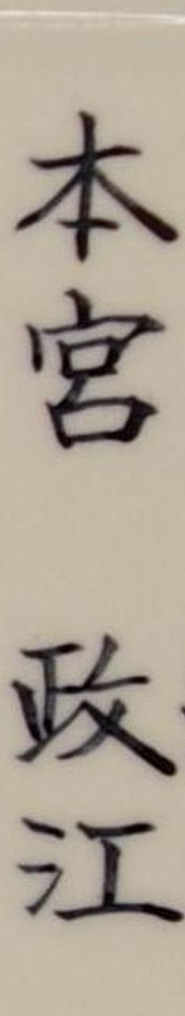本宮政江
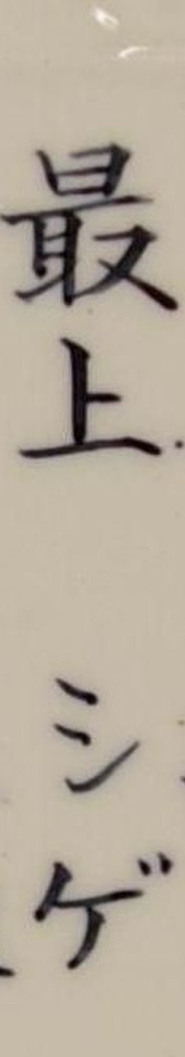最上シゲ

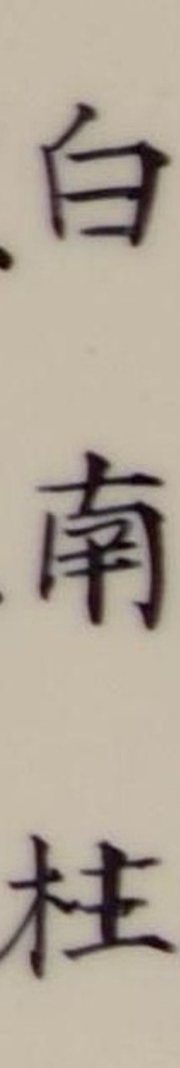白南柱
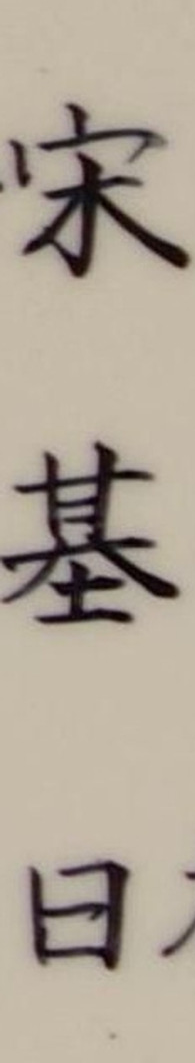宋基日
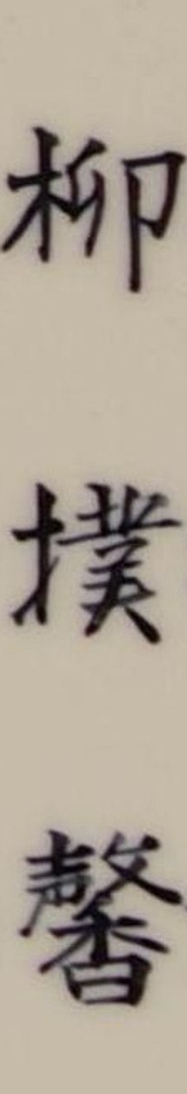柳撲馨
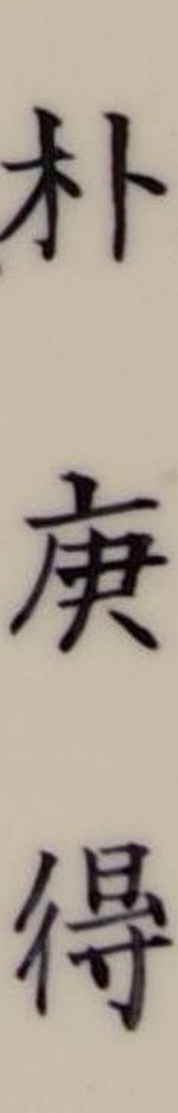朴庚得
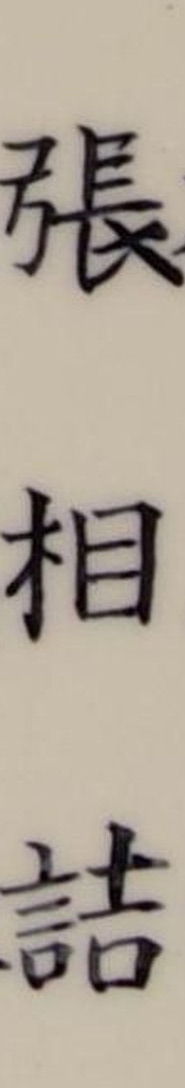張相詰
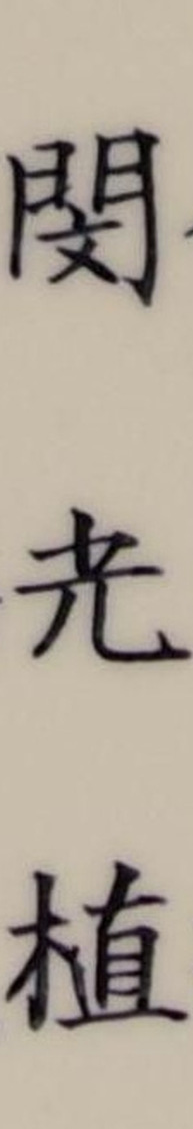閔光植
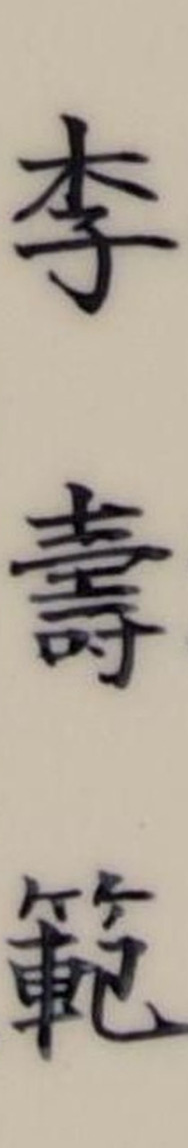李寿範
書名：E~L
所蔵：高野山金剛峯寺
